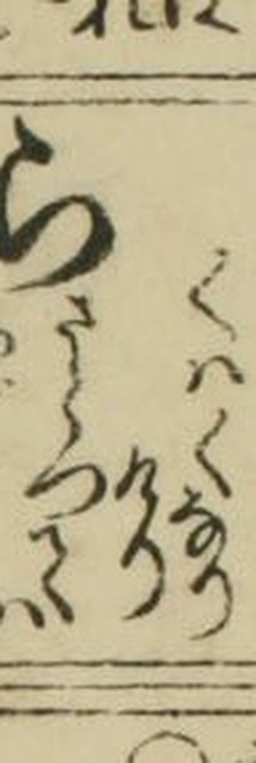さとつては
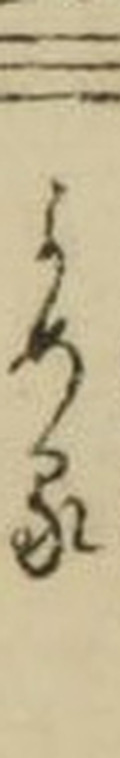よめる
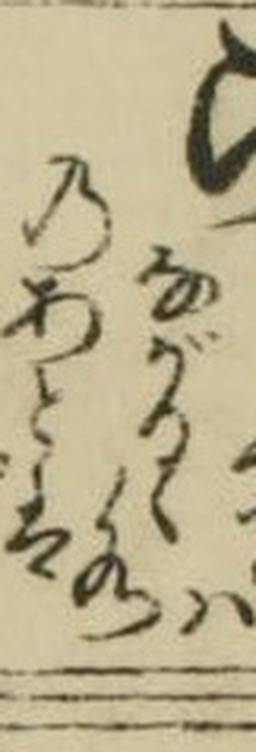のあとは
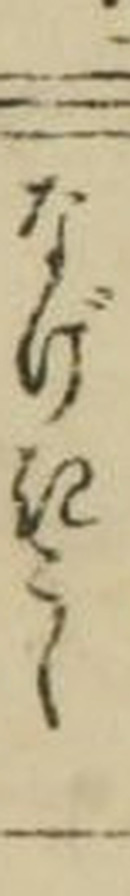なげきこし
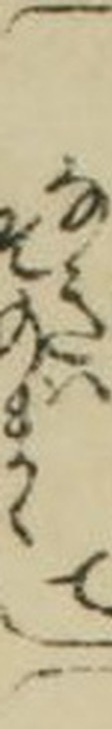そのまゝ
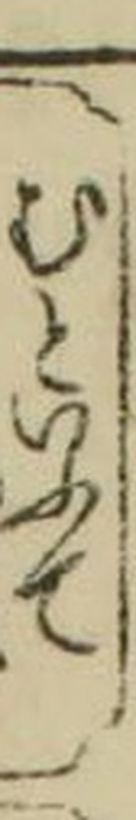むといふて
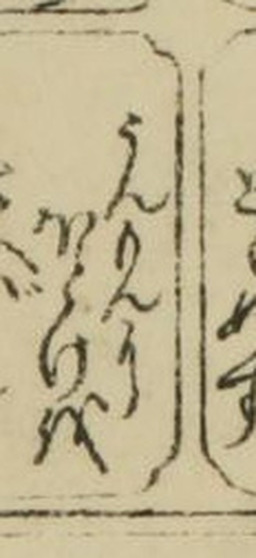うんもんに
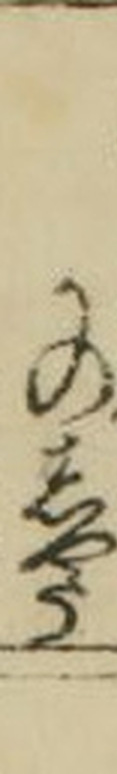かのしやう
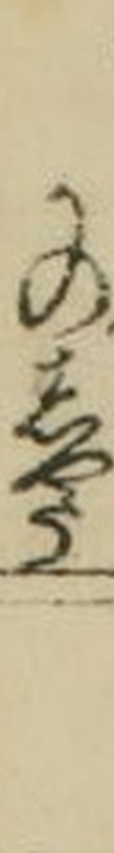かのしやう
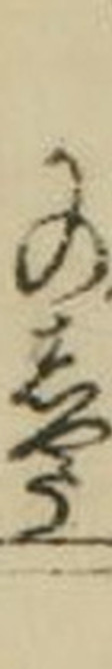かのしやう
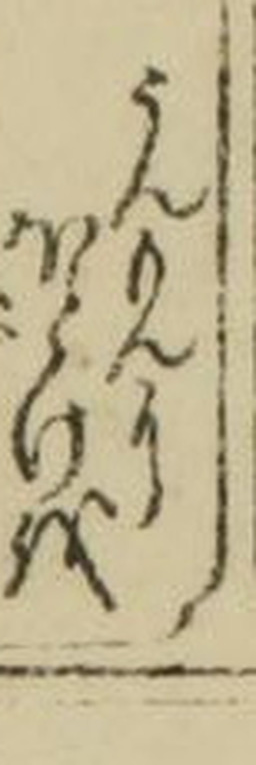ほとけを
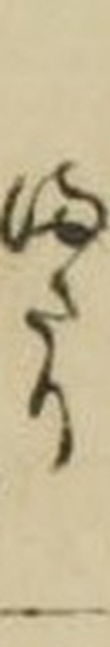まさり
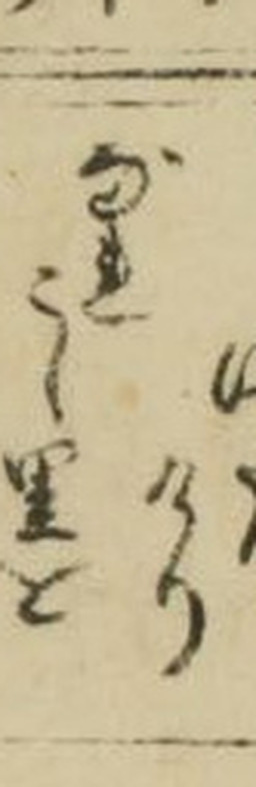こし里を
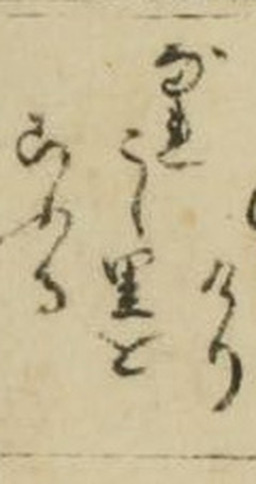こし里を
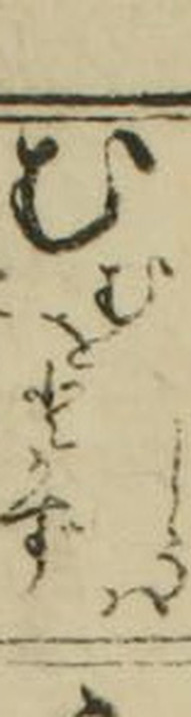むをとかず
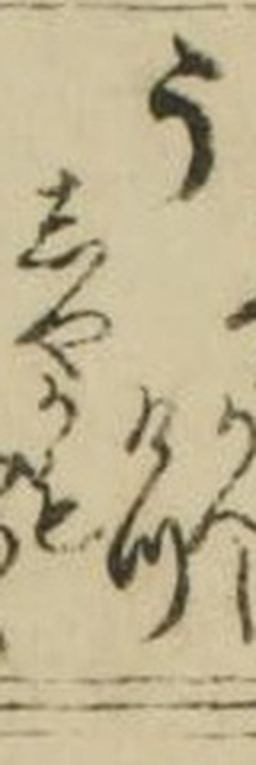しやかも
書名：女源氏教訓鑑
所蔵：東京学芸大学附属図書館
